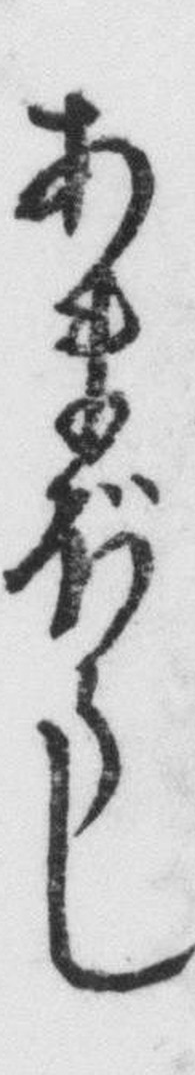あまぼらし
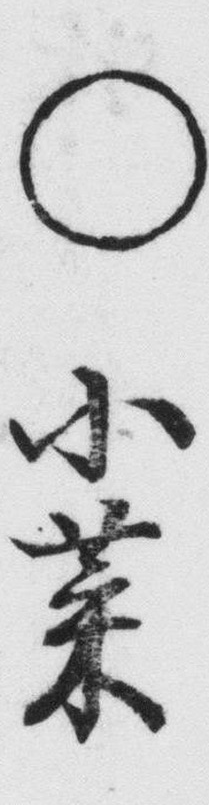〇小菜

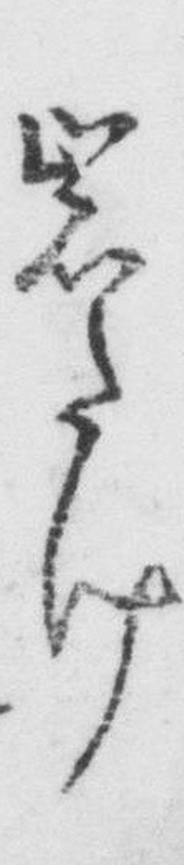岩たけ
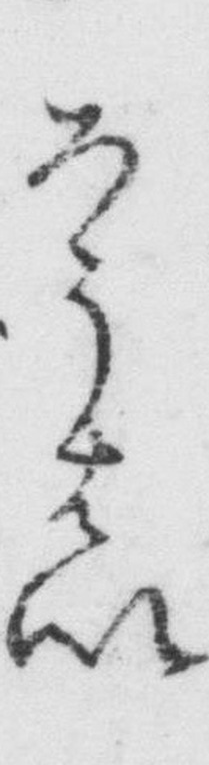ろうは以
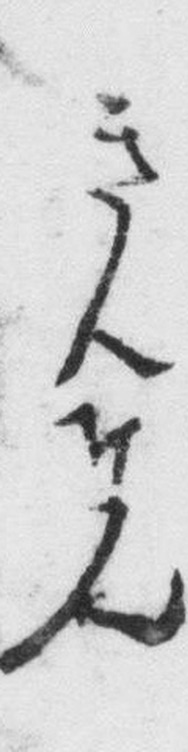きんなん

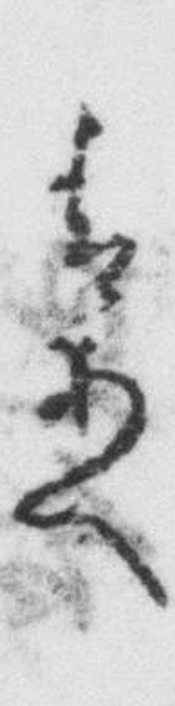青あへ
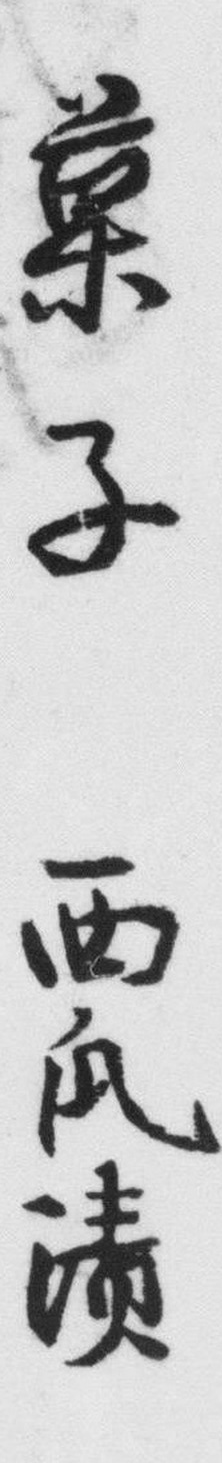菓子西瓜漬
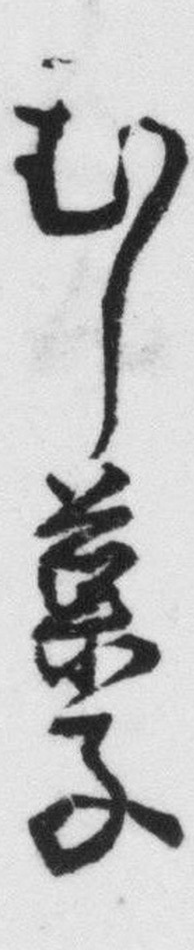むし菓子
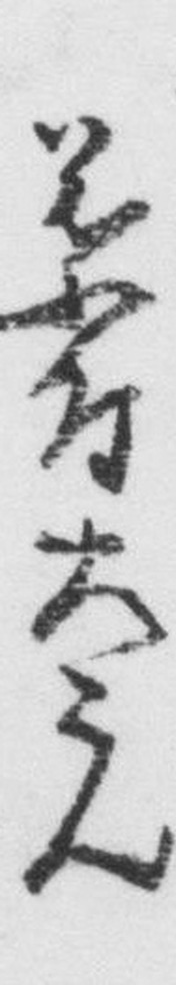葉付大こん
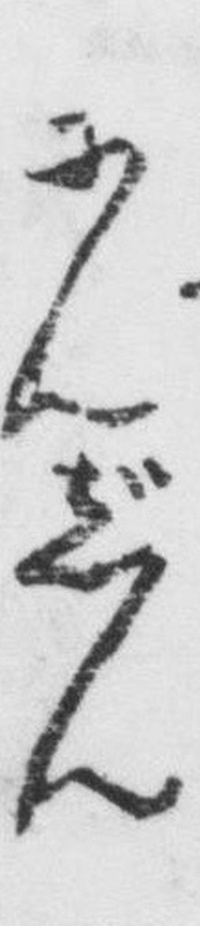尓んじん

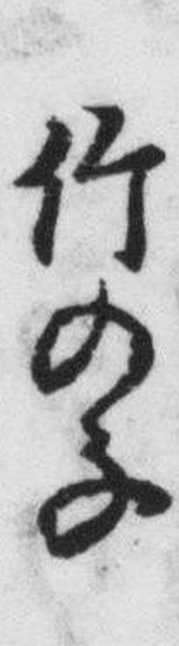竹の子
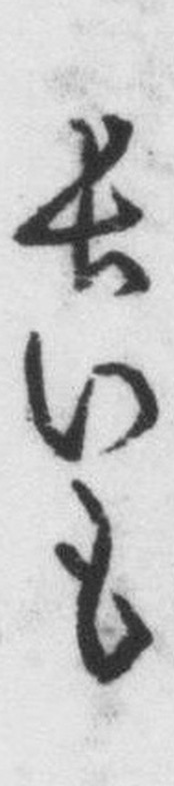長いも
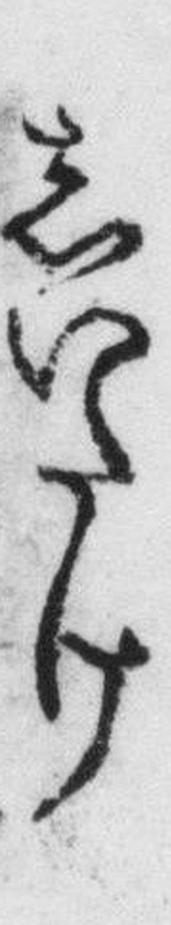志いたけ
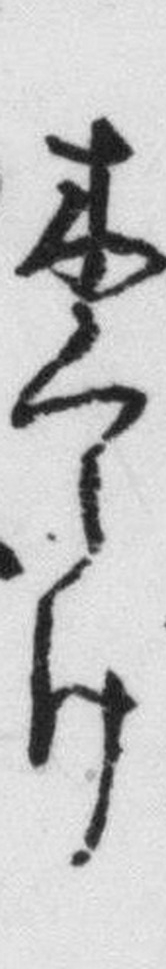木くらけ
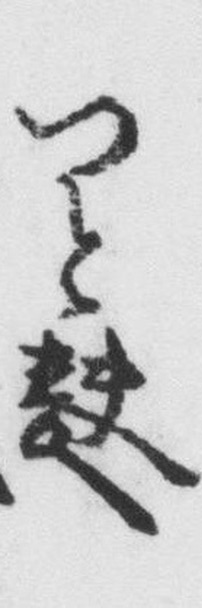つと麩
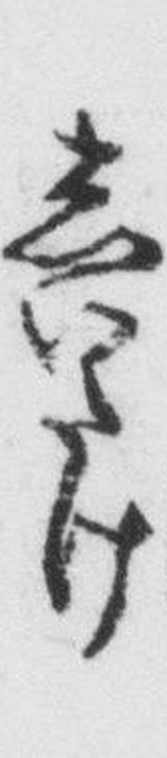志いたけ
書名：普茶料理抄
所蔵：大阪府立大学学術情報センター 国文学研究資料館
